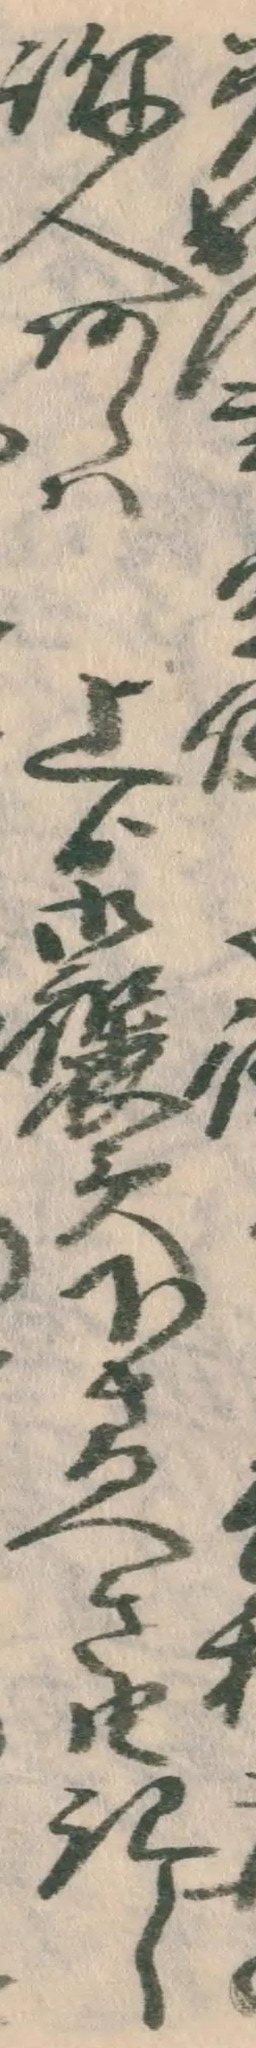訴人あらハ上ゟ御褒美下さるへき由記し
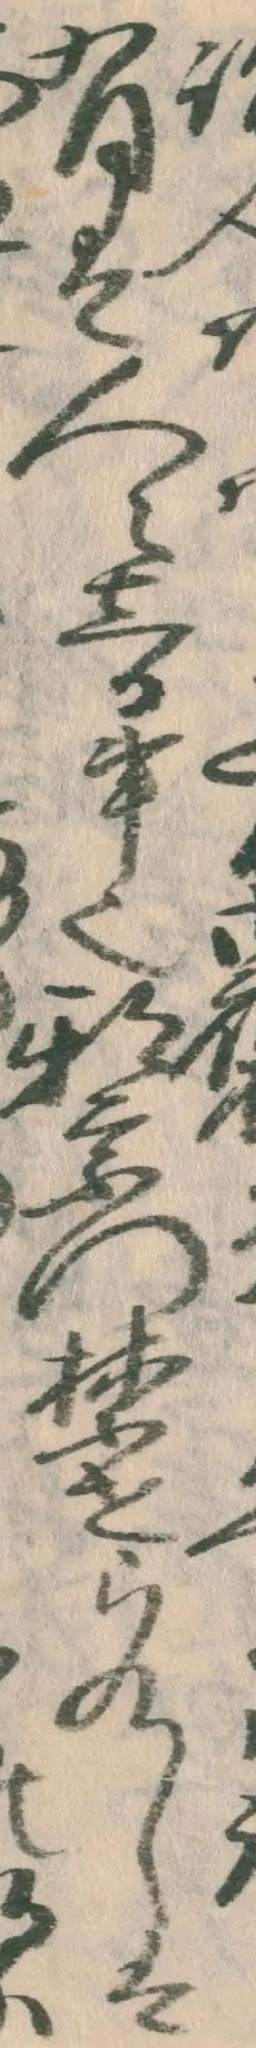有は人々しる事也邪宗門禁せられしは
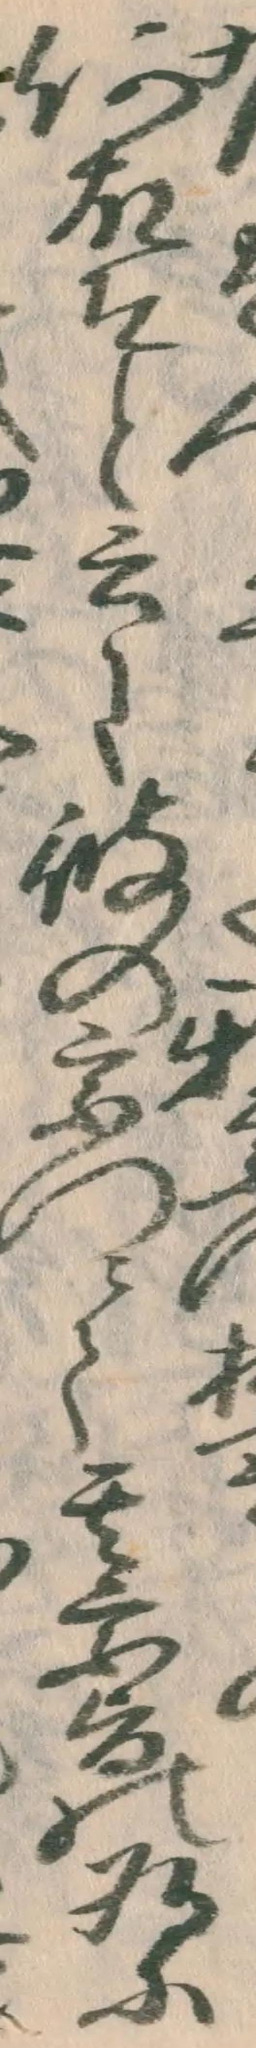何故そと云に彼の宗門ニて其宗旨の為に
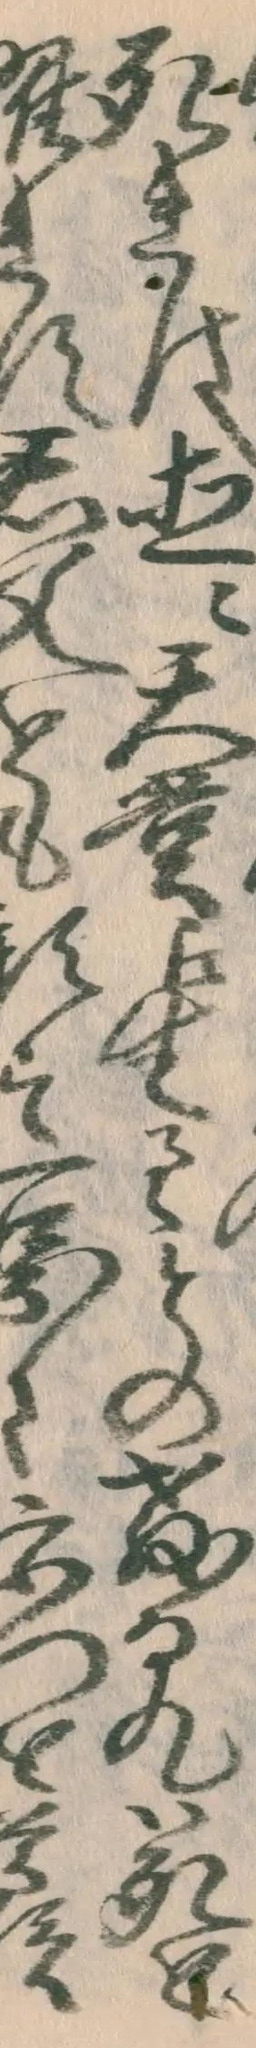懼れす君父をも顧す一圖に宗門を尊信
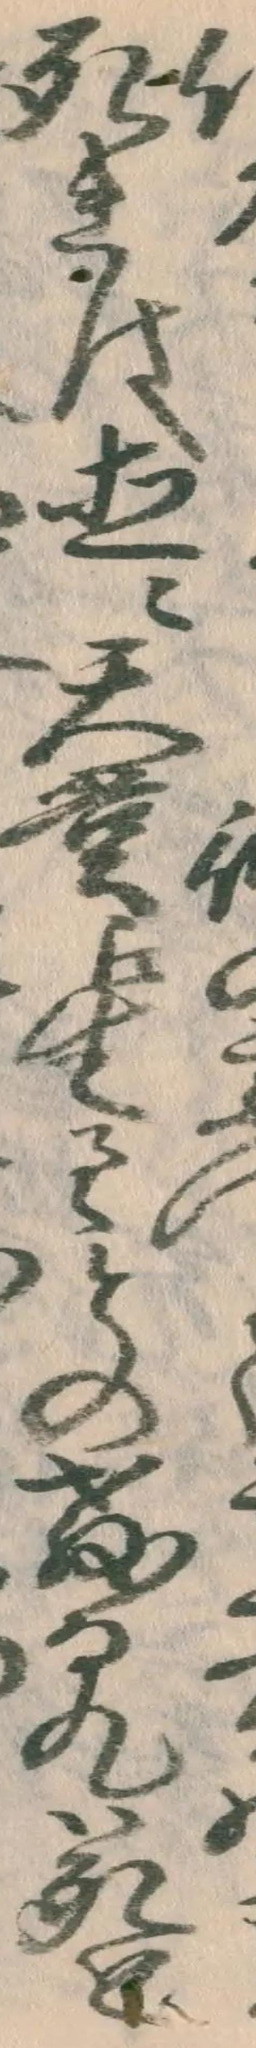死れは直ニ天堂江生るゝとの教なれハ死を
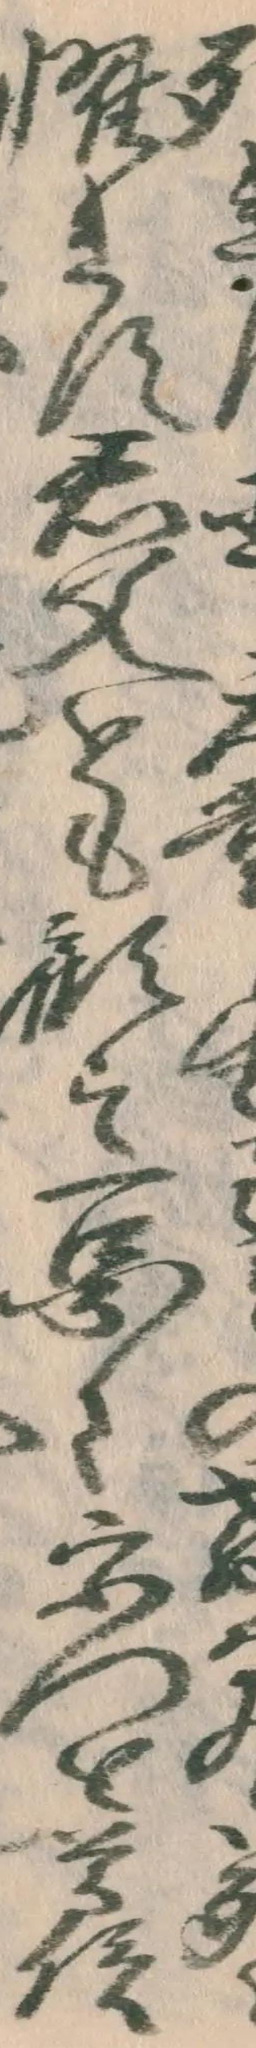懼れす君父をも顧す一圖に宗門を尊信
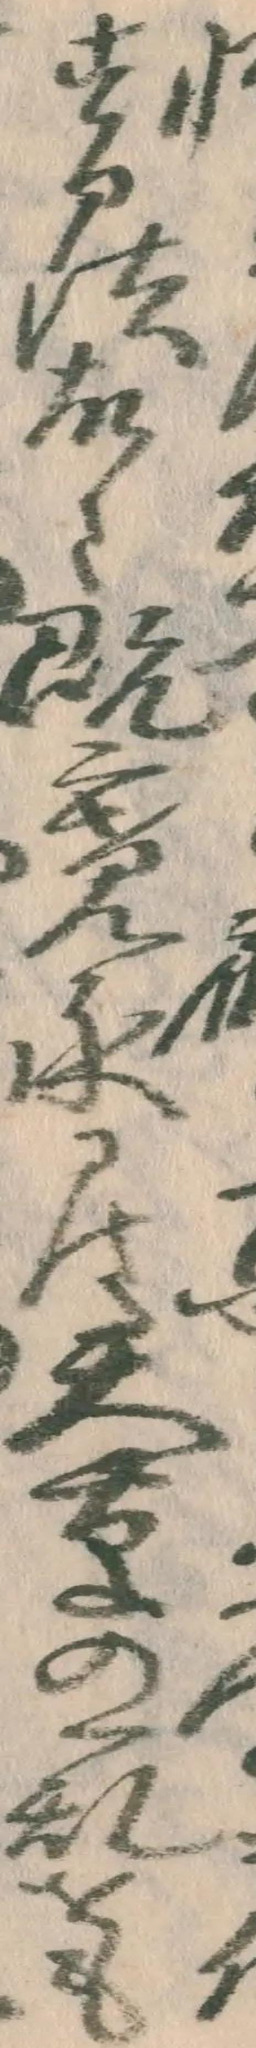する法故に既寛永には天草の一乱をも
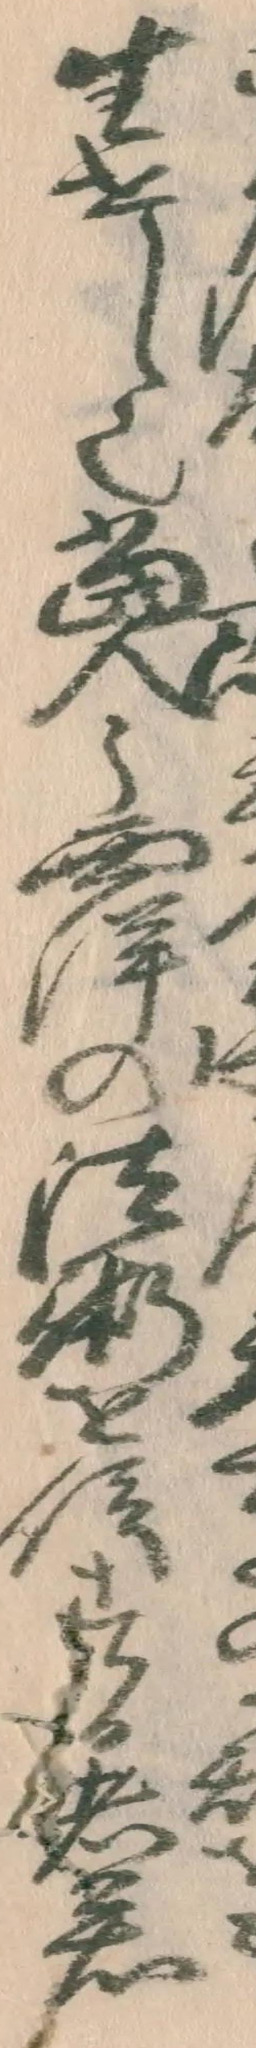生せし也當今西洋の法術を信する者若
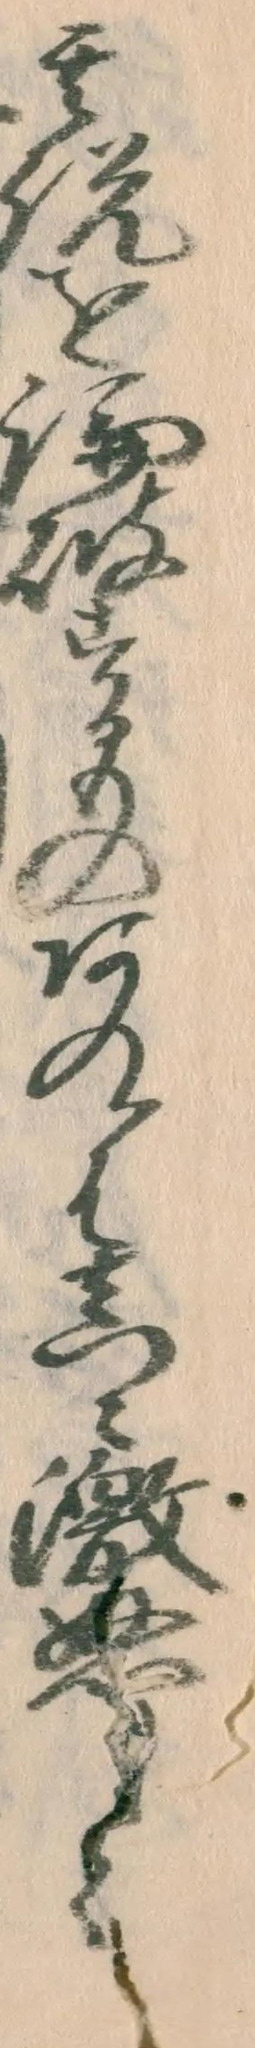其節を論破するものあれは真ニ激怒して
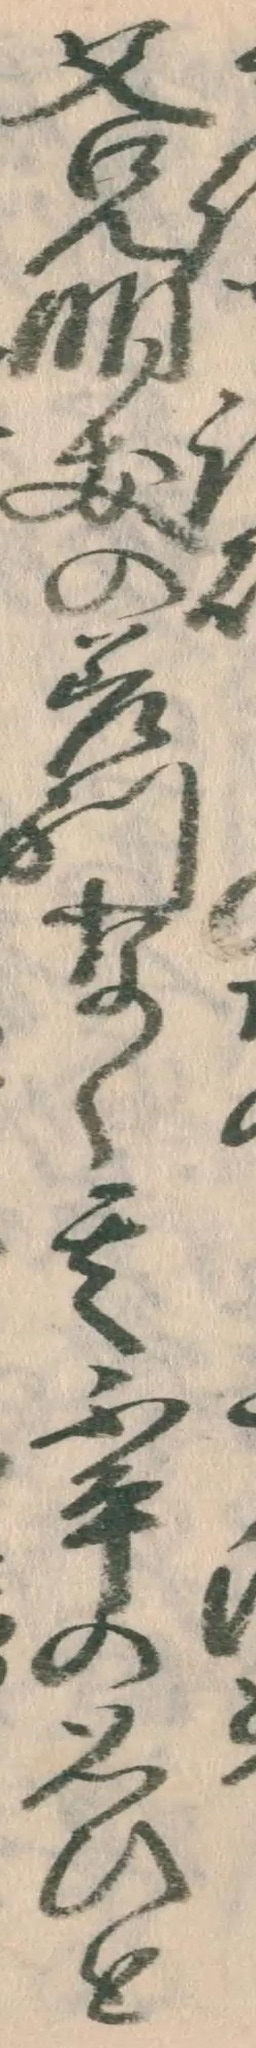父兄朋友の差別なく其不平の思ひを
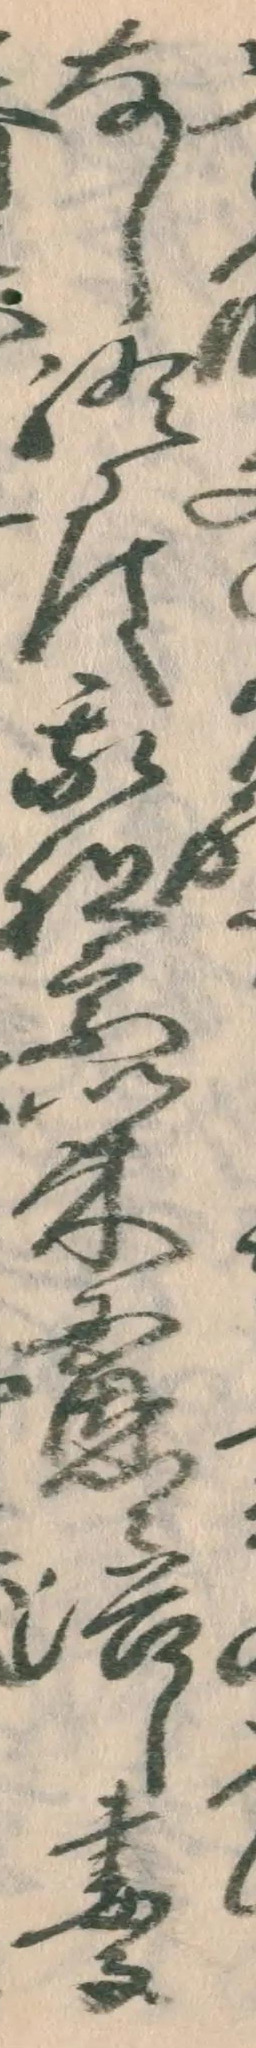なし終には我祖宗以来国恩ニ浴し妻子
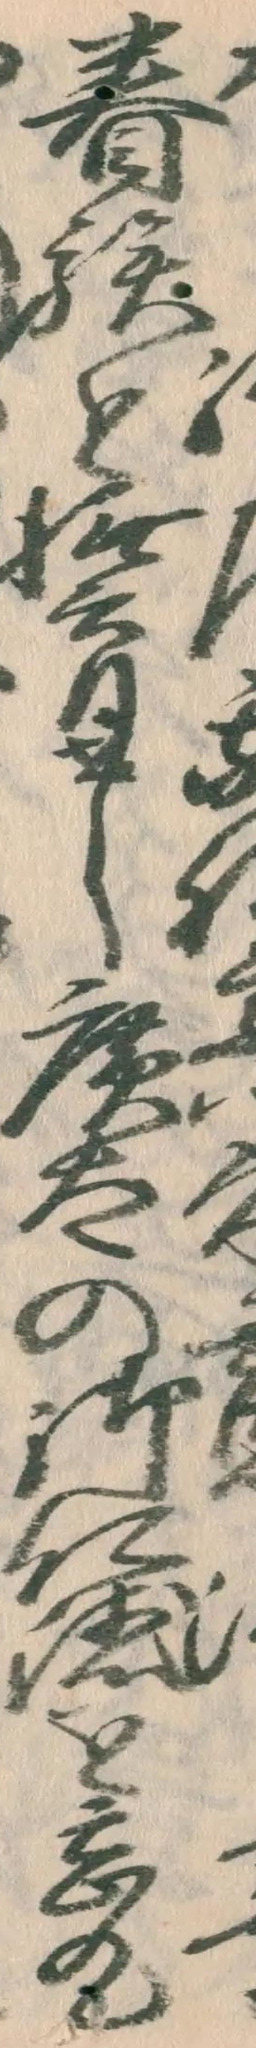眷属を撫育せし廣太の御仁徳を忘れ
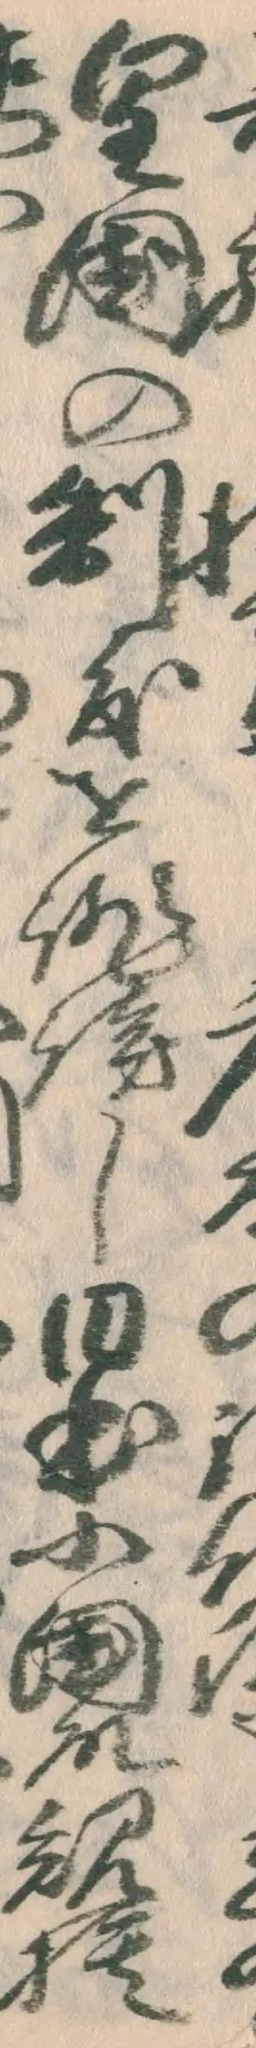皇国の制度を誹謗し日本小国故規模
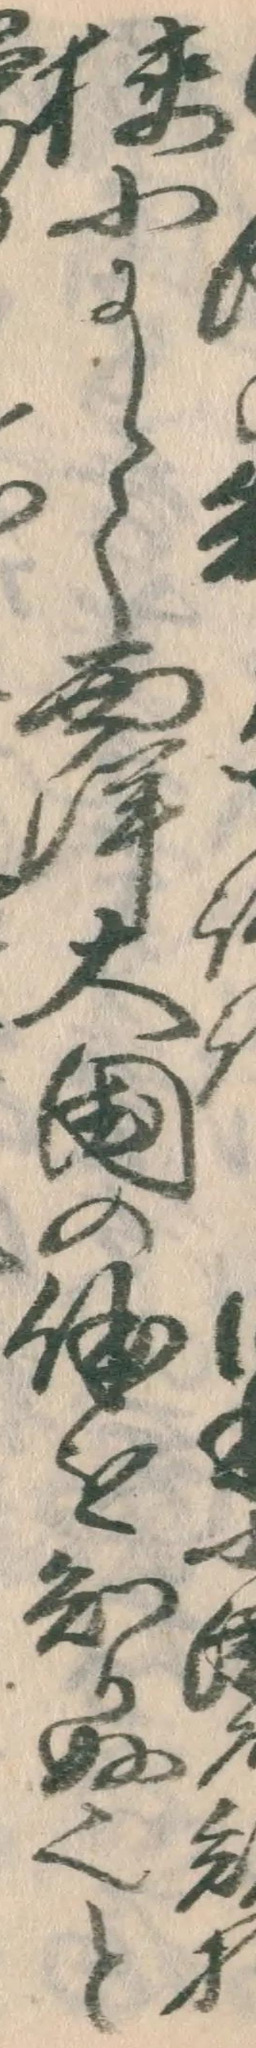狭小にして西洋大国の体を知りぬ也と
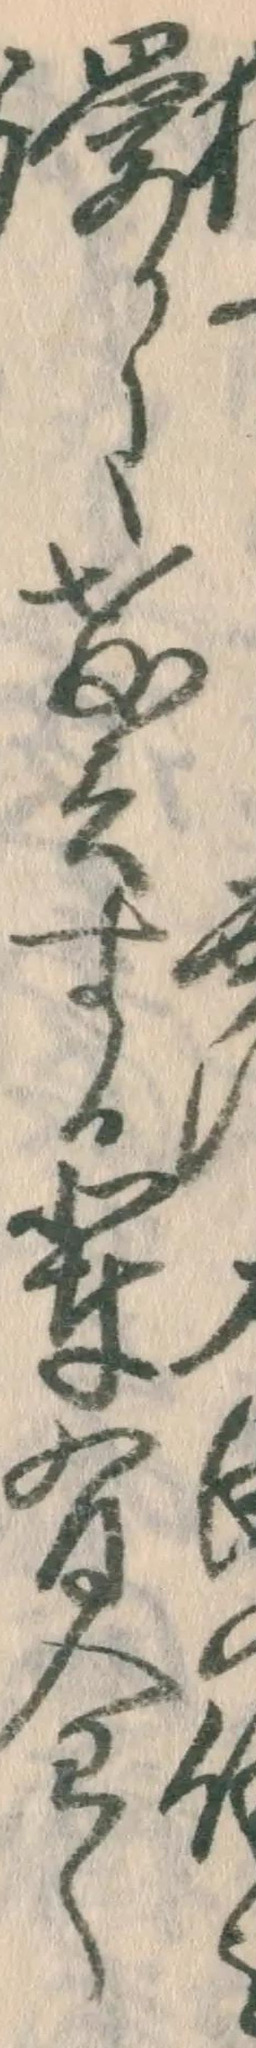漫りに教言する輩有全く
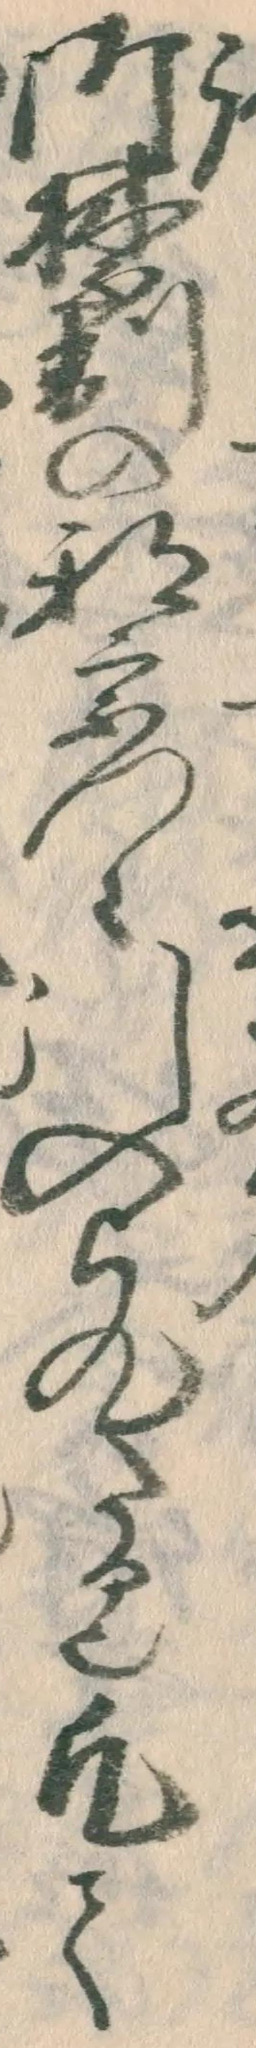御禁制の邪宗門ニ引入られたる也凡て
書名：麗斎叢書. 20
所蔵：国立国会図書館 National Diet Library, JAPAN
